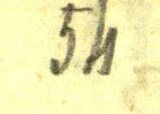54
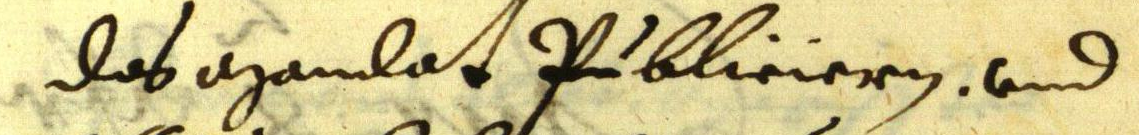das Mandat Pūbliciern. vnd
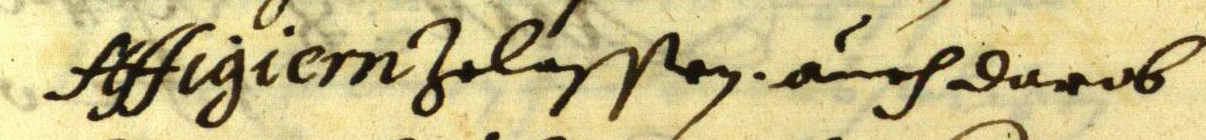Affigiern Zelassen. aūch darob
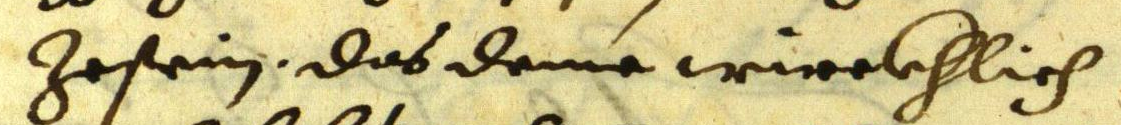Zesein. das deme wircklich
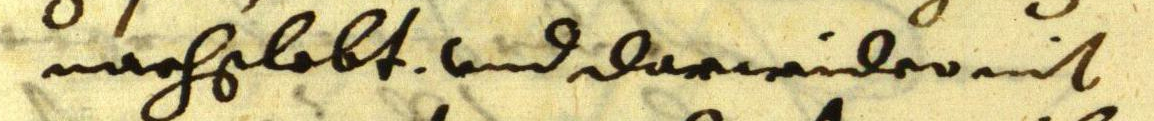nachglebt. vnd darwider nit
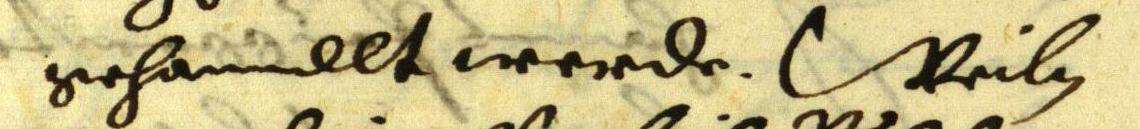gehanndlt werde. Weiln
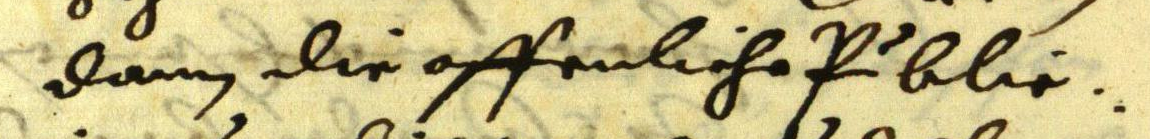dann die offenliche Pūblic¬
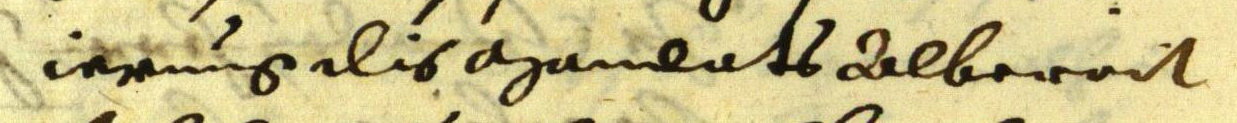ierūng dis Mandats Alberait
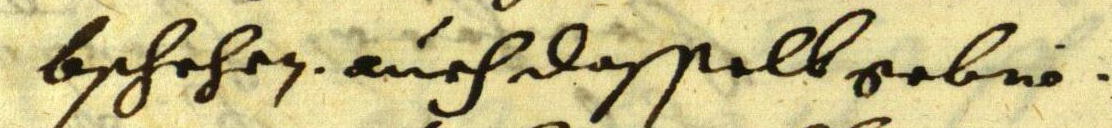beschehen. aūch dasselb gebir¬
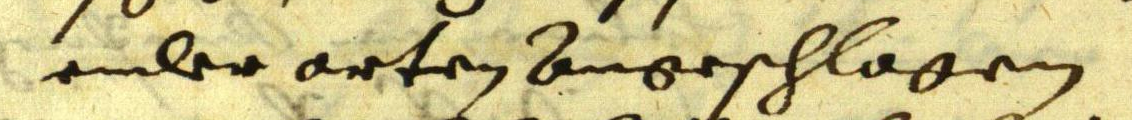ennder orten Angeschlagen
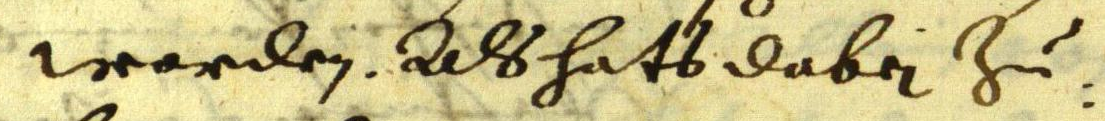werden. Als hats dabej Zū¬
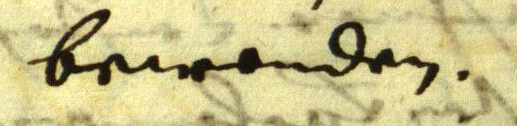bewenden.
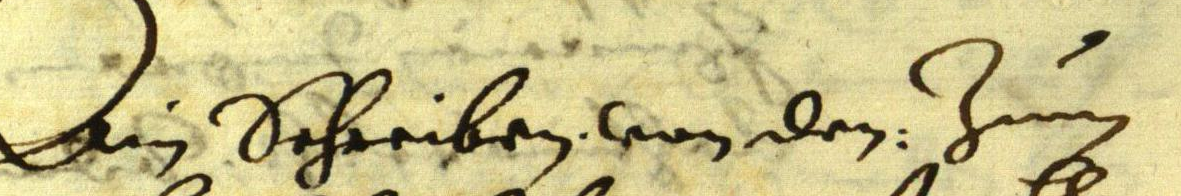Ain Schreiben. von den: Zūm
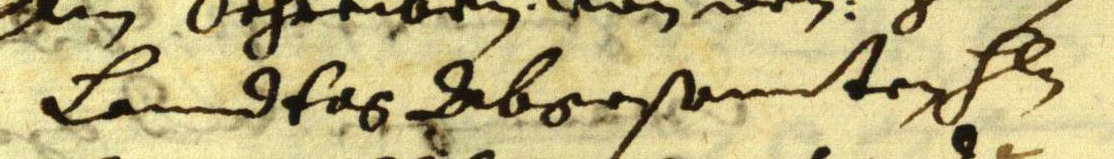Lanndtag Abgesanndten hln
